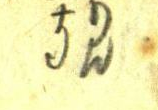52
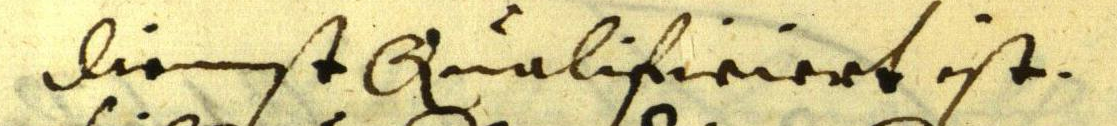diennst Qūalificiert ist.
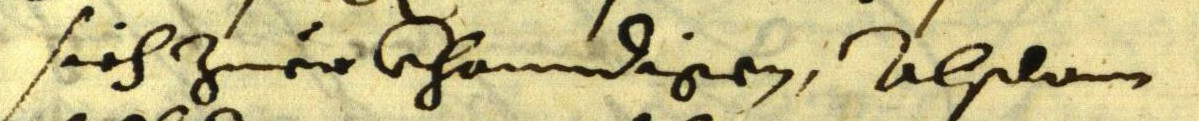sich Zūerkhonndigen, Alsdann
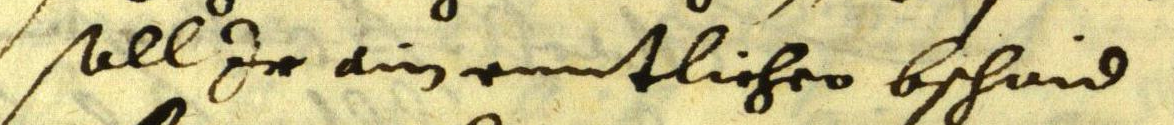soll Ir ain enntlicher bschaid
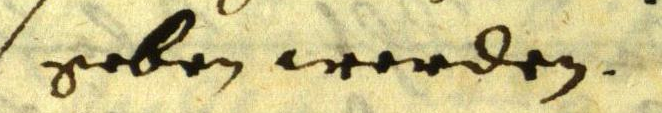geben werden.
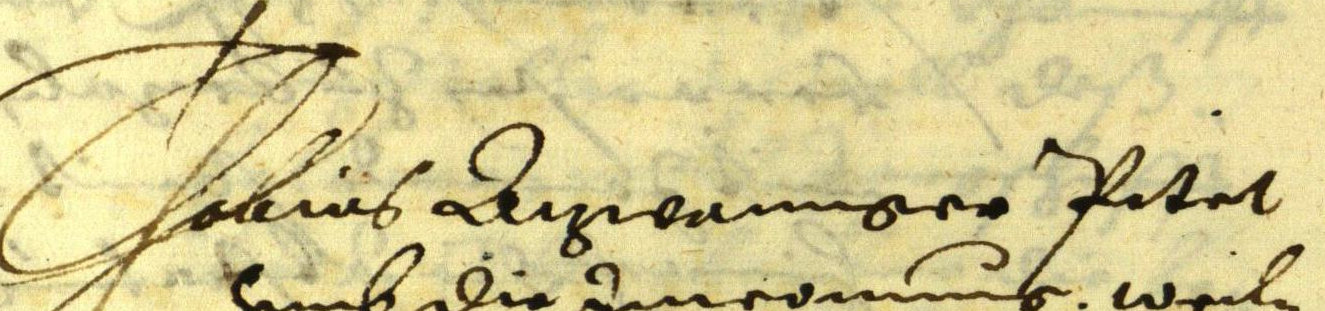Thobias Azwannger Pitet
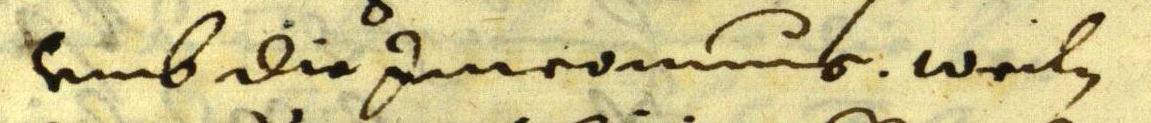vmb die Inwonnūng. weiln
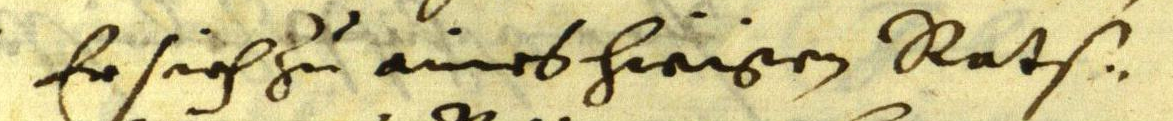Er sich Zū aines hieigen Rats¬
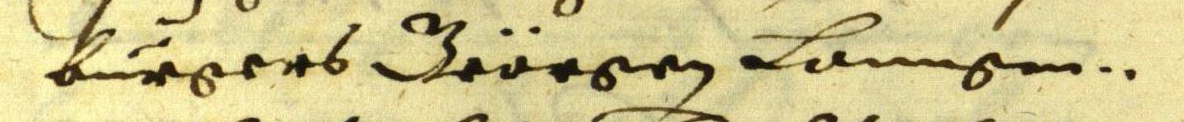būrgers Geörgen Lanngen¬
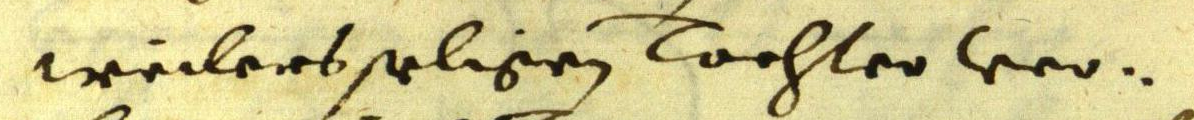weilers seligen Tochter ver¬
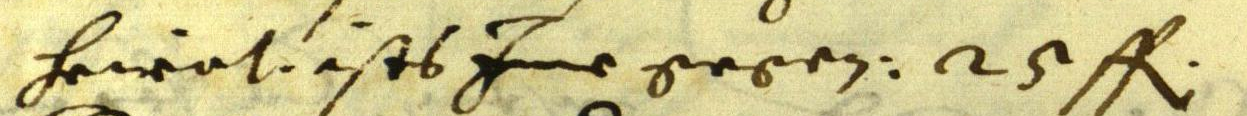heirat. ists Ime gegen: 25 fl.
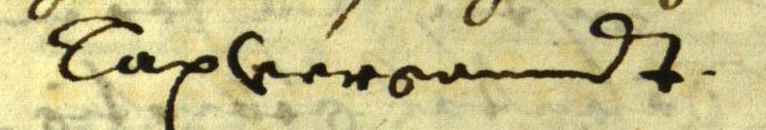Tax vergonndt.
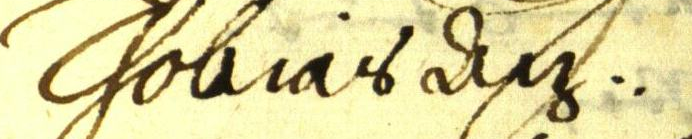Thobias Az¬
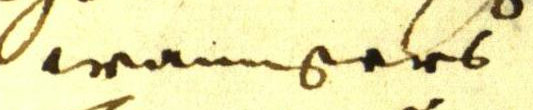wanngers
